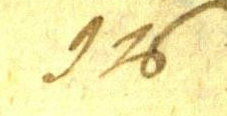116
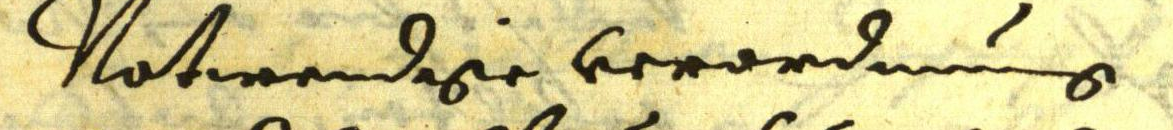Notwendige verordnūng
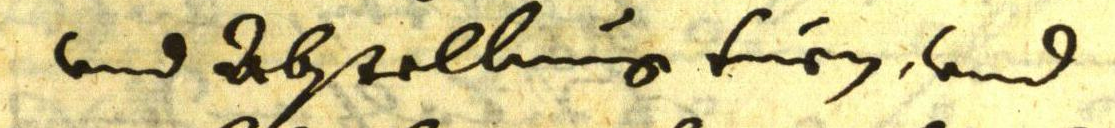vnd Abstellūng tūen, vnd
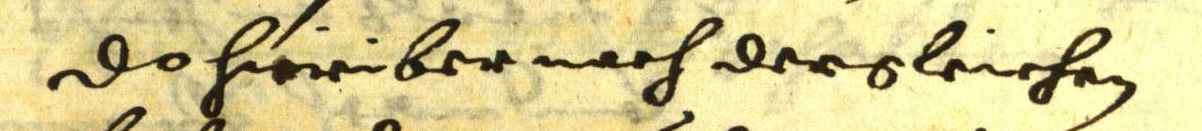da hieriber noch dergleichen
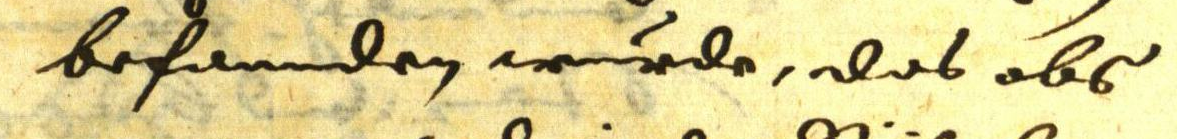befannden wūrde, das obs
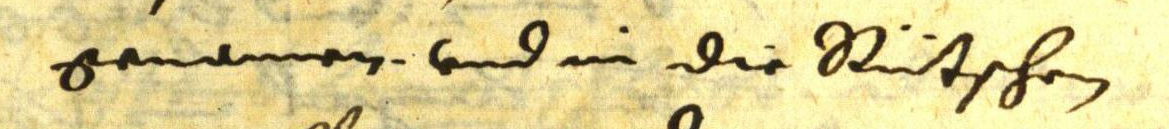genomen. vnd in die Rütschen
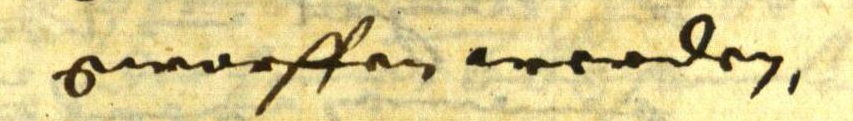gworffen werden,
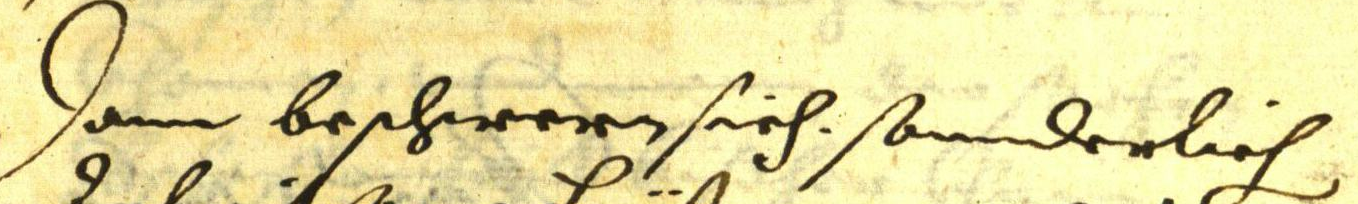Dann beschwern sich. sonnderlich
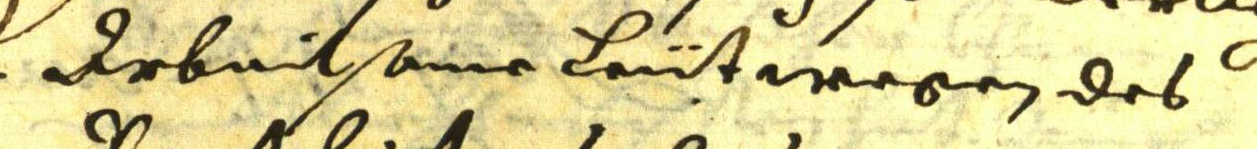Arbait same Leüt wegen des
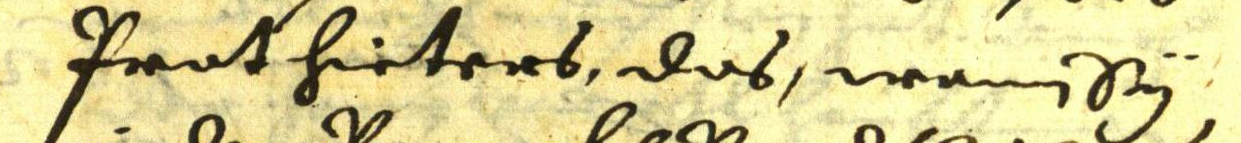Prothieters, das, wann Sÿ
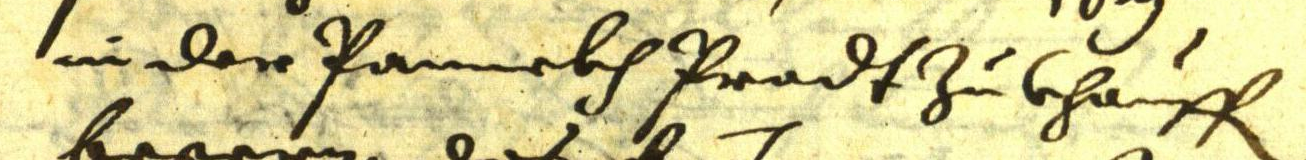in der Pannckh Prodt Zū khaūff
